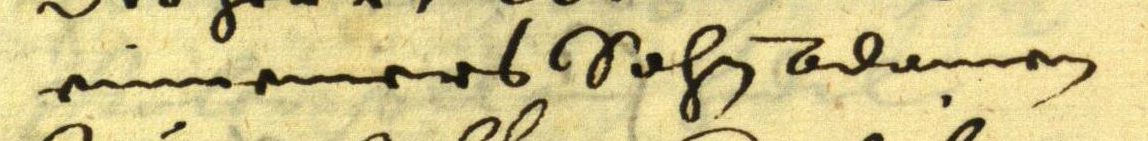einnemers Sohn Adamen
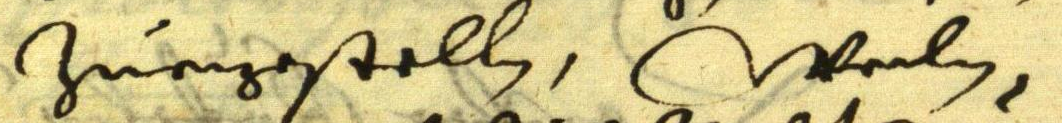Zūezestelln, Weiln
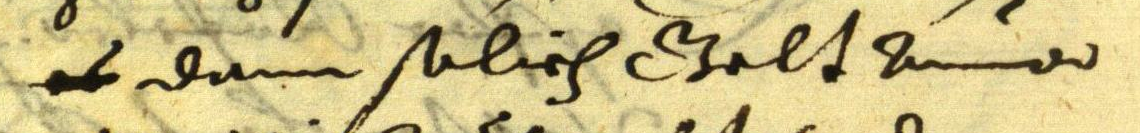es dann solich Gelt Anūor
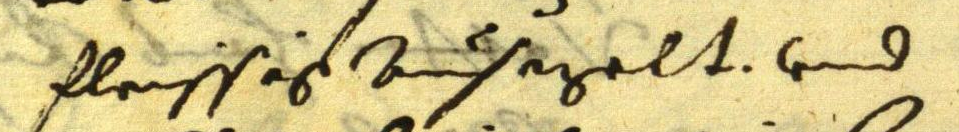fleissig Aūszelt. vnd
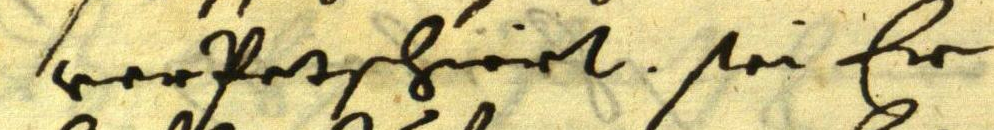verPetschiert. sei Er
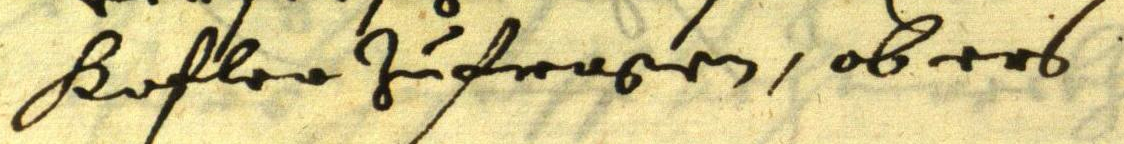Kofler Zūfragen, ob ers
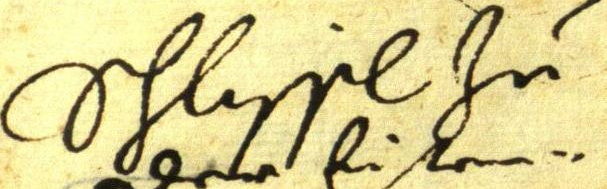Schlissl Zū
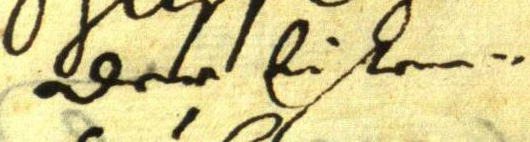der Eisen¬
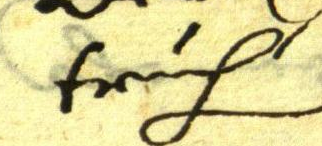trūh
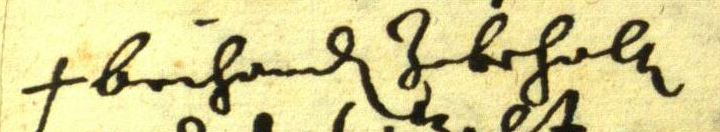beihand Zūbehalt
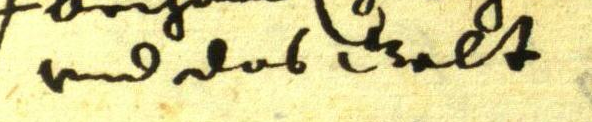vnd das Gelt
